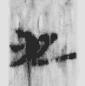九
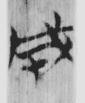成
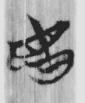{母日}
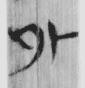外
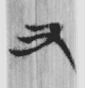又
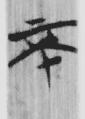不
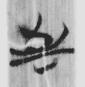至
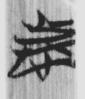者
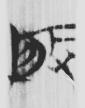殷
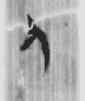人
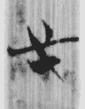弋
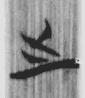之
